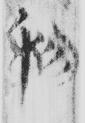利
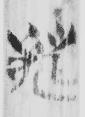萬
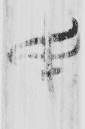民
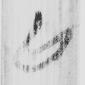㠯（以）
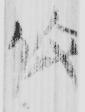攸
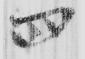四
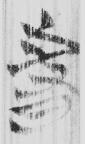時
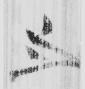之
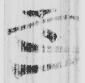正
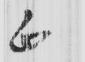㠯（以）
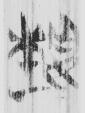埶
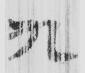九
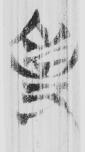事
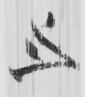之
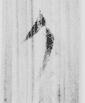人
